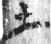土
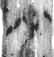少
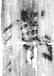盍（蓋）
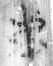東
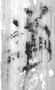南
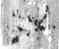之
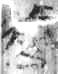遇（寓）
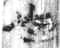必
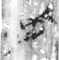男
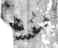出
